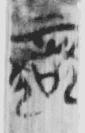獄
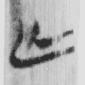亡
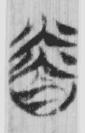{炎自}
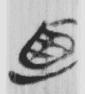廼
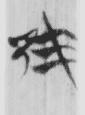隹
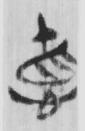惪
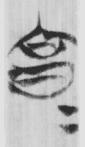亯
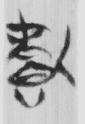{才食卩}
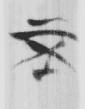不
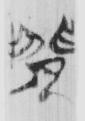{門丨卩}
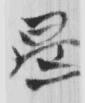是
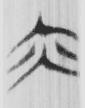亦
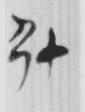引
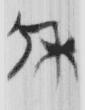休
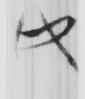女
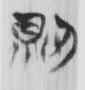則
